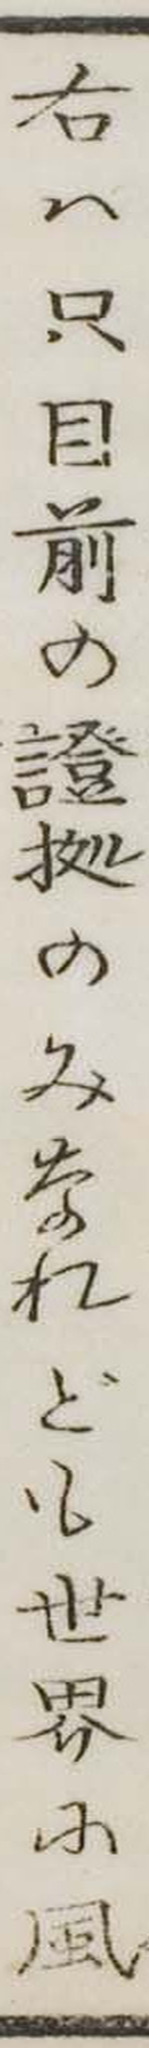右は只目前の證拠のみなれども世界に風
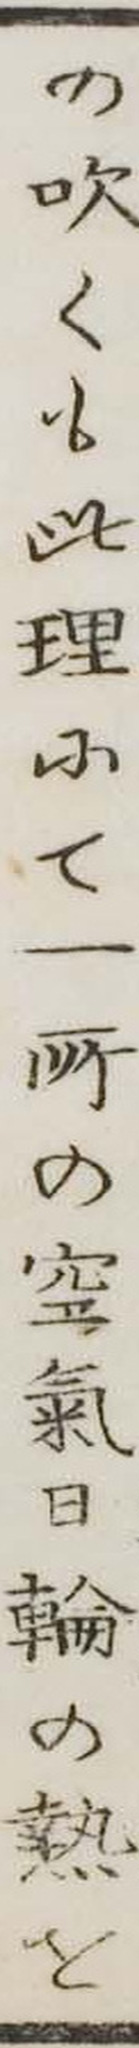の吹くも此理にて一所の空氣日輪の熱を
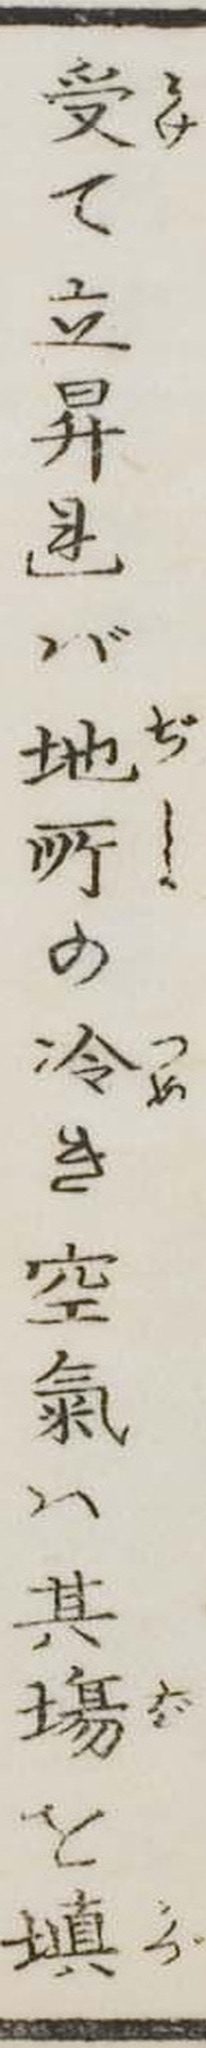受て立昇れば地所の冷き空氣は其塲を填
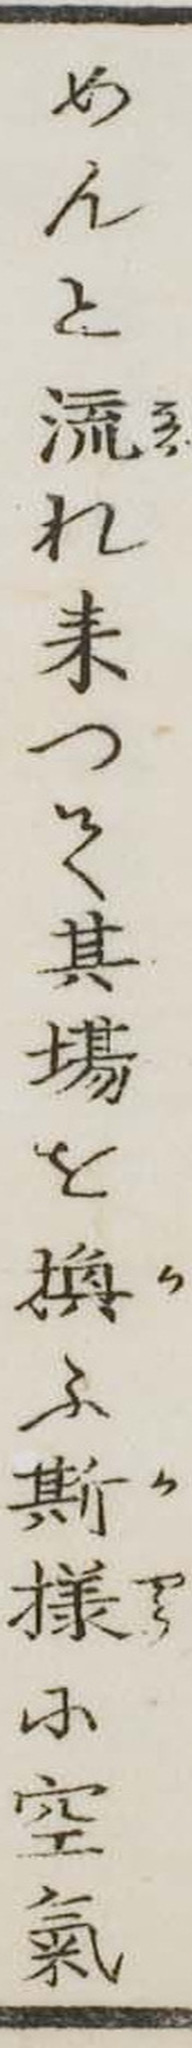めんと流れ来つて其塲を換ふ斯様に空氣
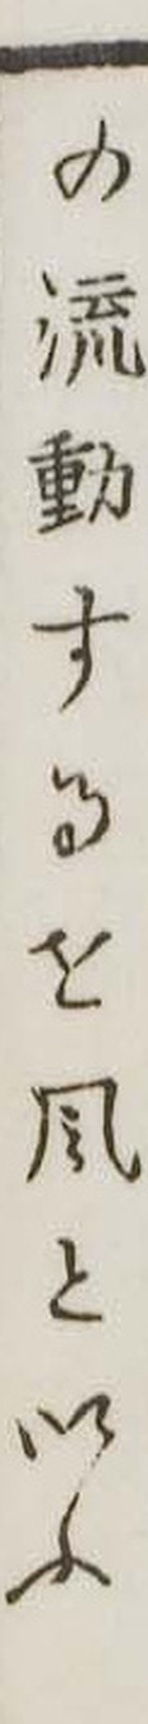の流動するを風といふ
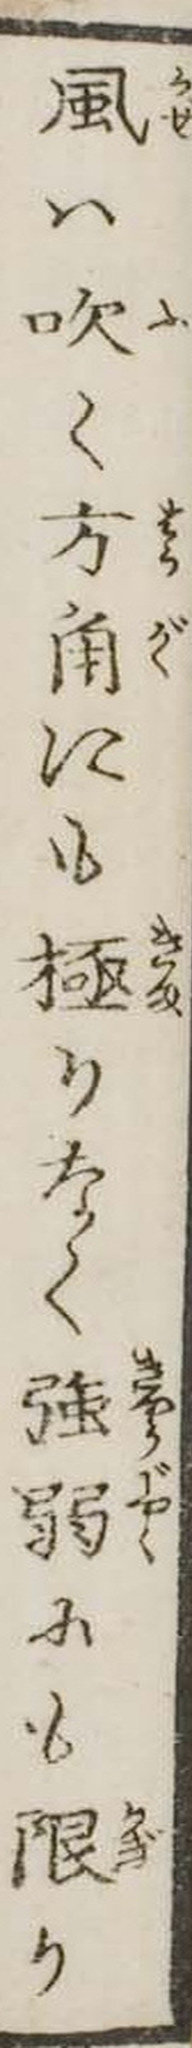風は吹く方角にも極りなく強弱にも限り
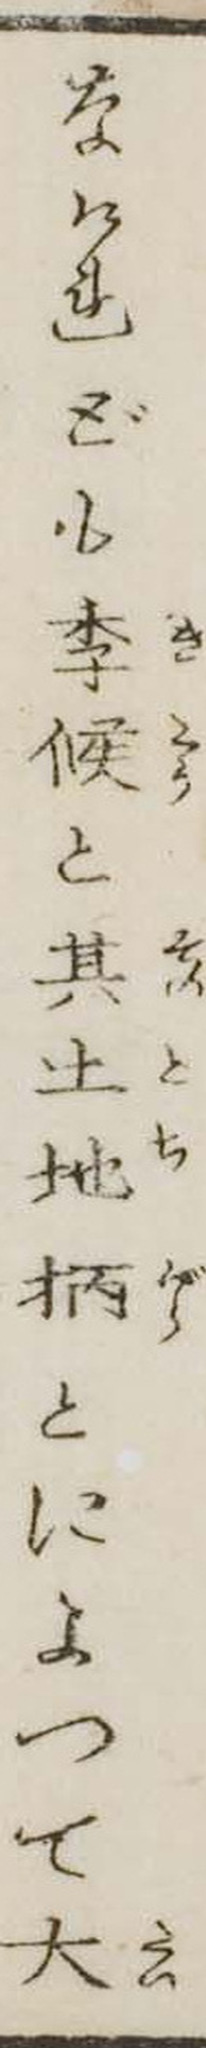なけれども季候と其土地柄とによつて大
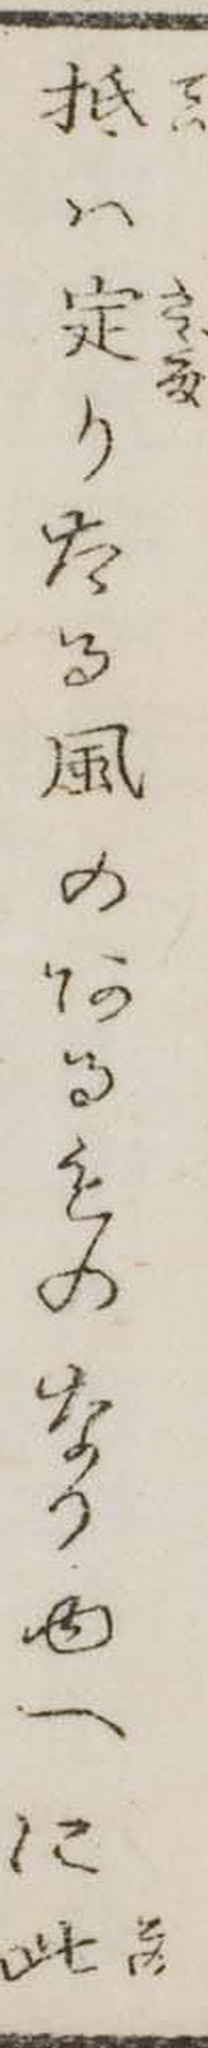抵は定りたる風のあるものなりゆへに此
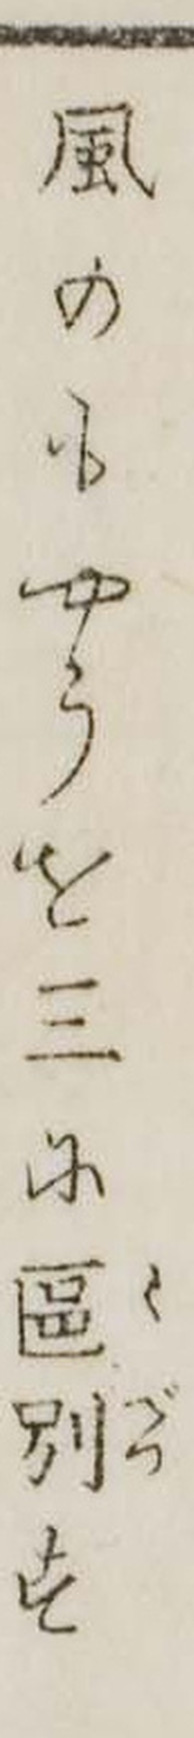風のもやうを三に區別す
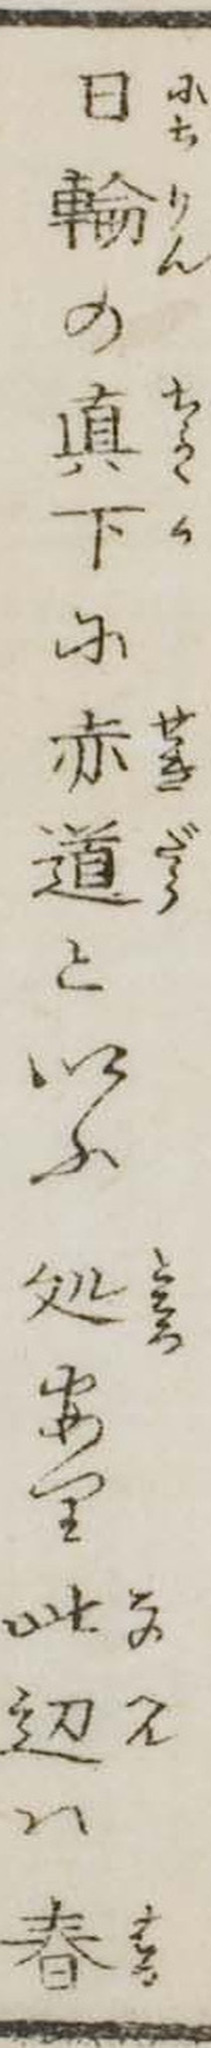日輪の直下に赤道といふ処あり此辺は春
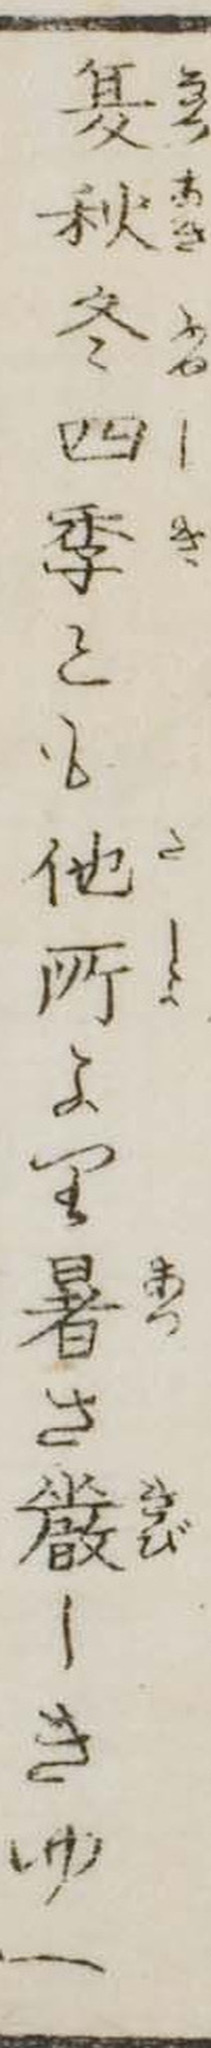夏秋冬四季とも他所より暑さ厳しきゆへ
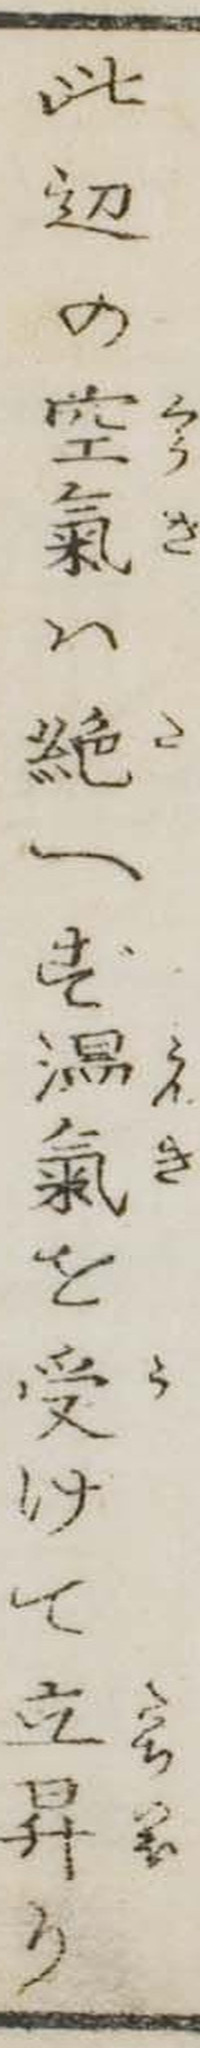此辺の空氣は絶へず温氣を受けて立昇り
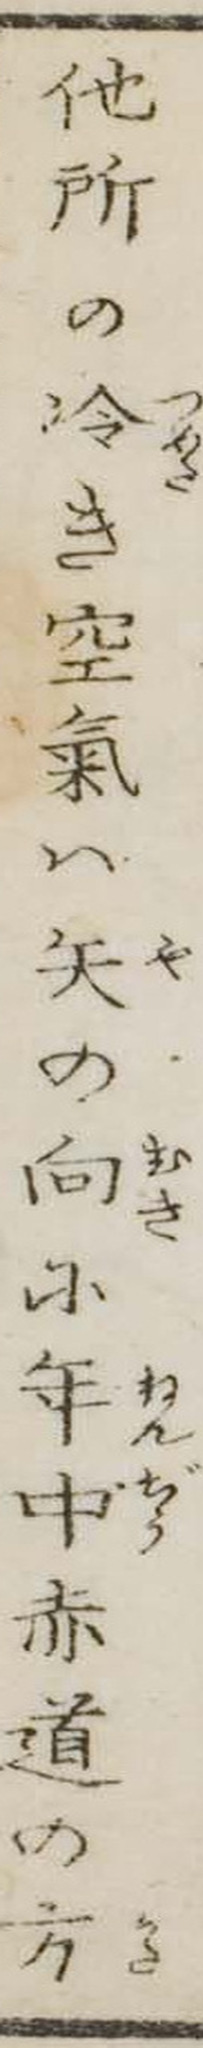他所の冷き空氣は矢の向に年中赤道の方

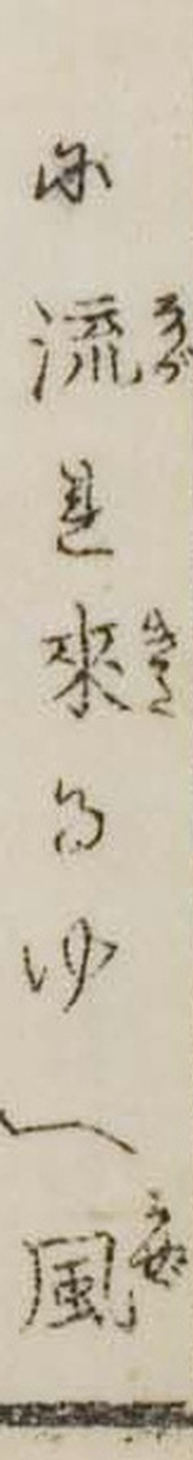に流れ來るゆへ風
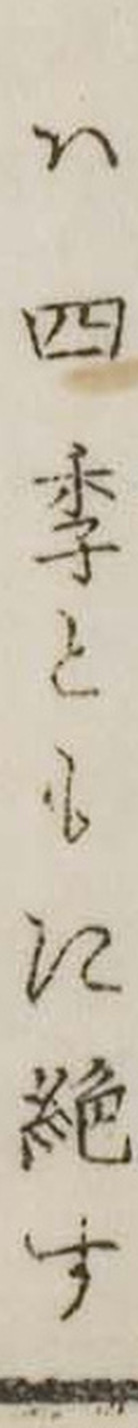は四季ともに絶す
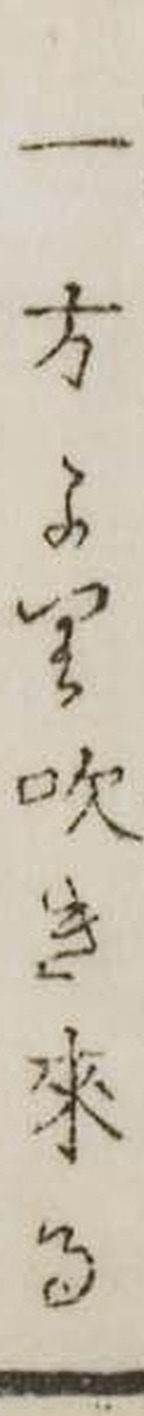一方より吹き來る
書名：究理知慧の勧 : 訓蒙画入 巻之2
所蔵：東京学芸大学附属図書館
